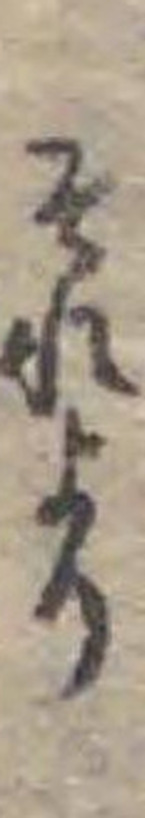それより
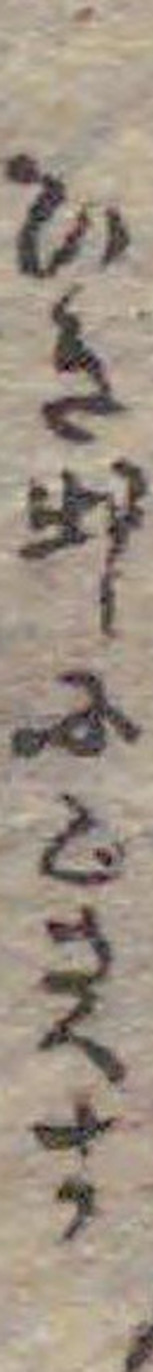ひき出しにござんす
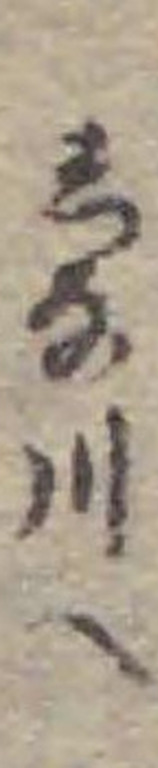しな川へ
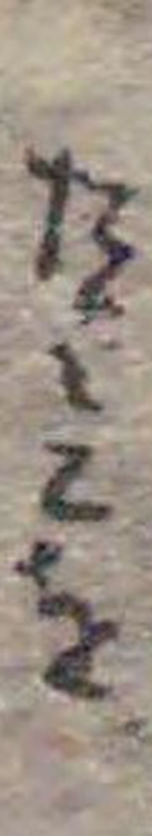たはこを
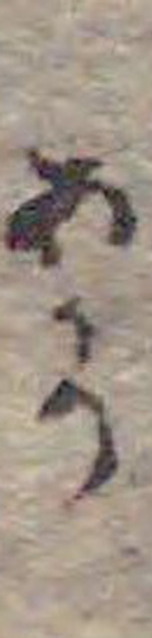あかり
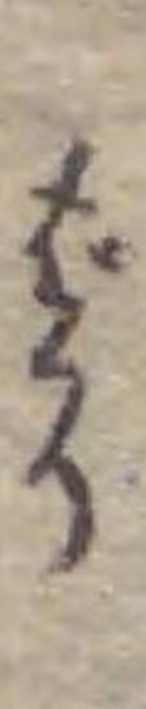ばかり
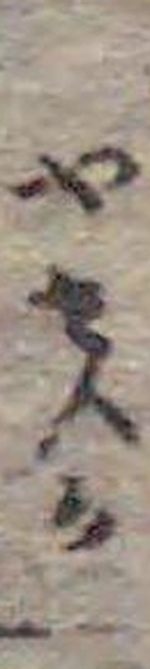やせんか
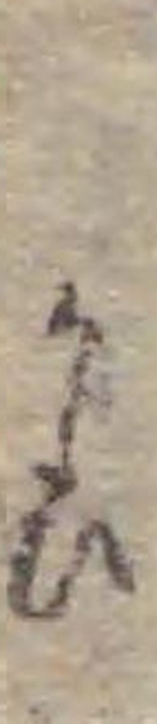かよひ
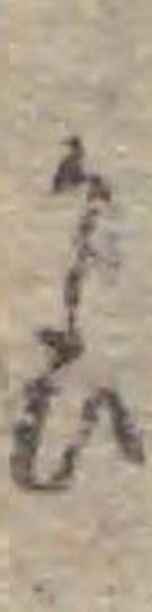かよひ
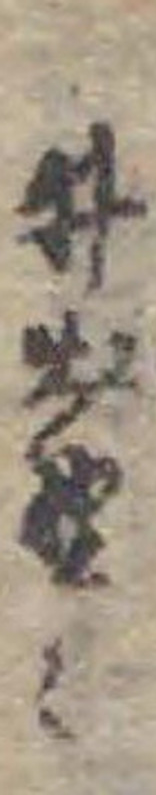井出野と
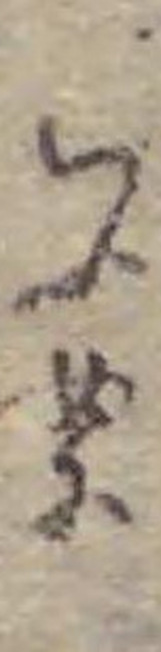いふ女に
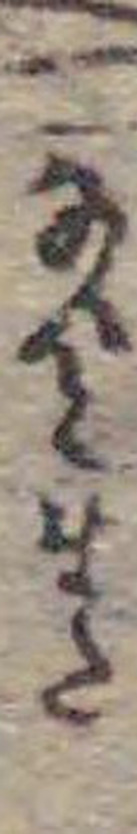なんとまた
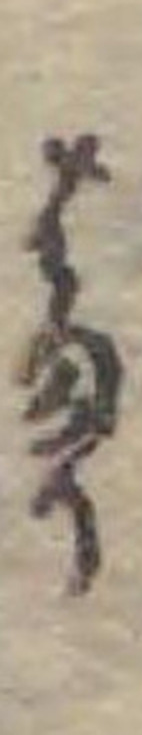はまり
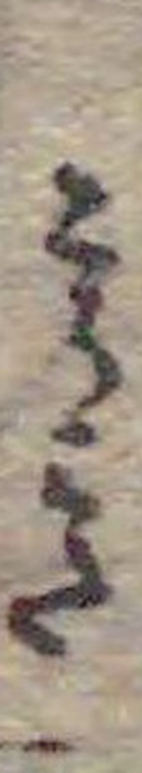こうみた
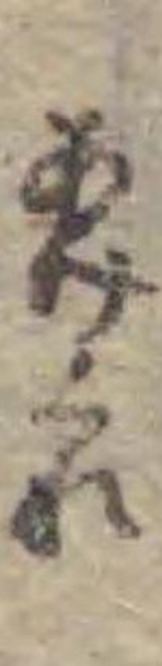あけくれ
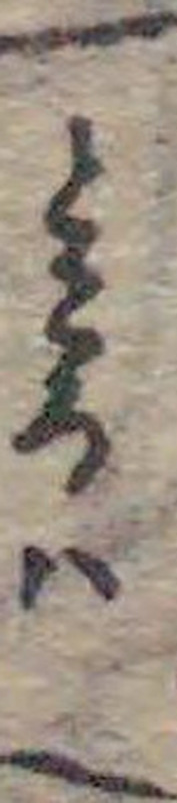ところは
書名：[化物一代記] : 5巻
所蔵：国立国会図書館 National Diet Library, JAPAN
